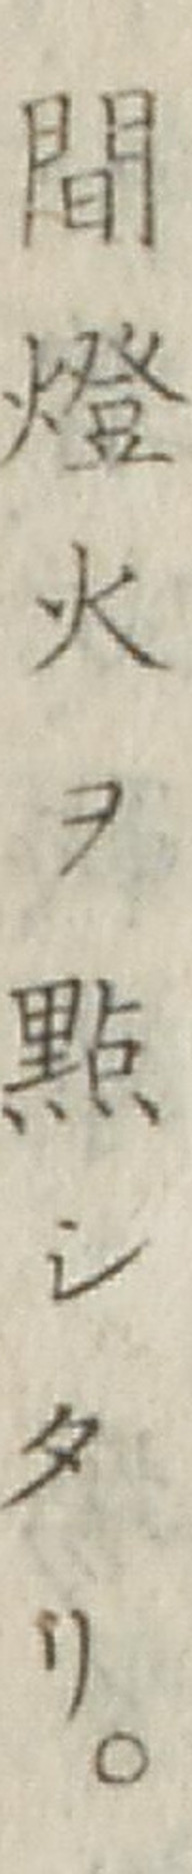間燈火ヲ点シタリ。
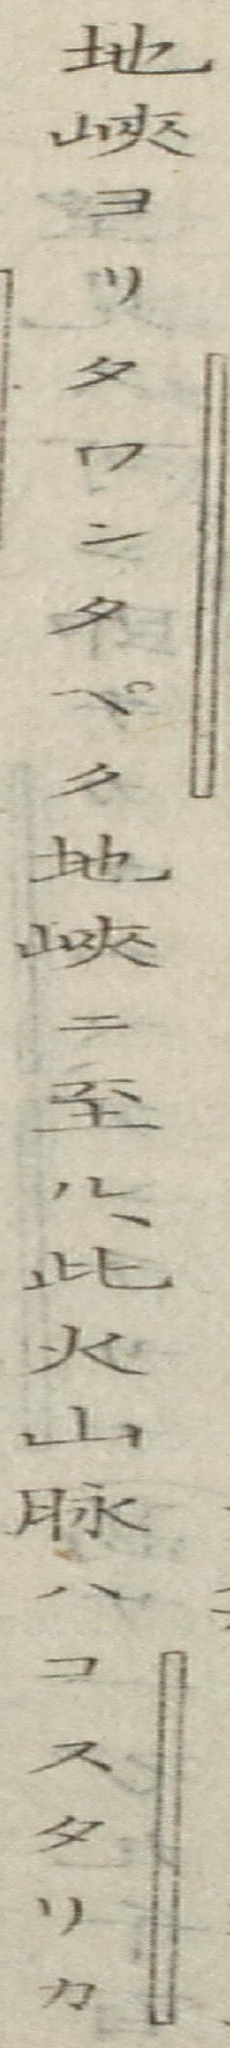地峡ヨリタワンタペク地峡ニ至ル、此火山脈ハコスタリカ
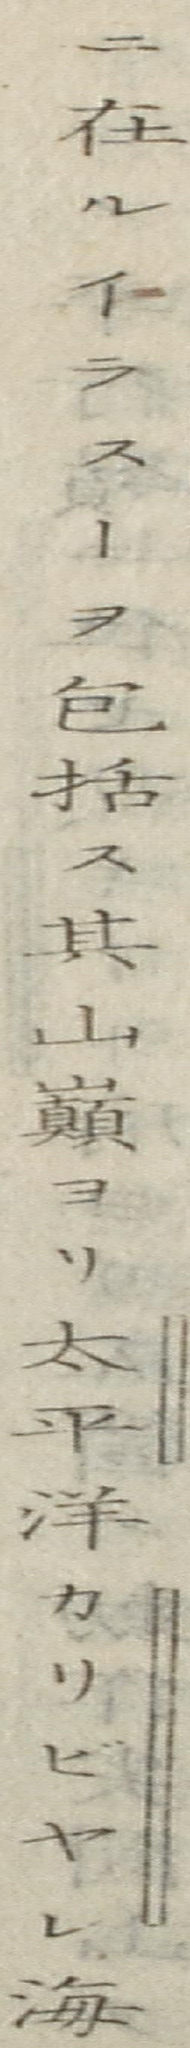ニ在ルイラスーヲ包括ス其山嶺ヨリ太平洋カリヒヤレ海
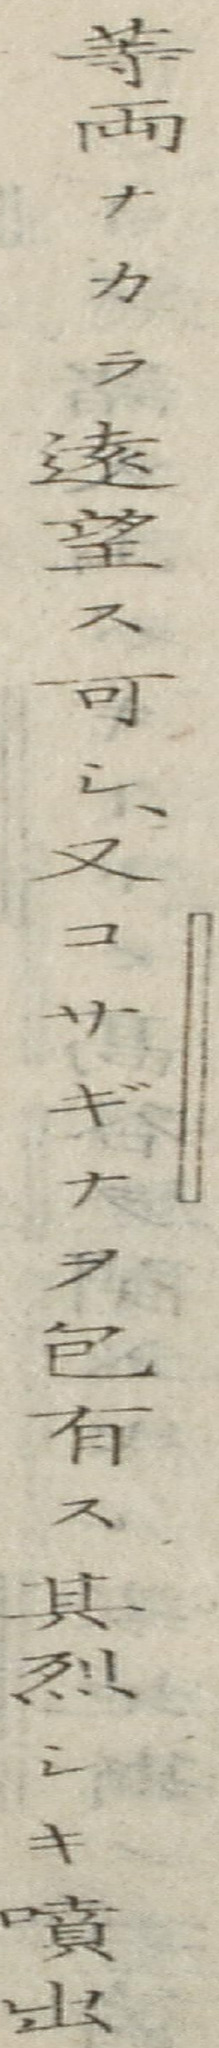等両ナカラ遠望ス可シ、又コサギナヲ包有ス其烈シキ噴出
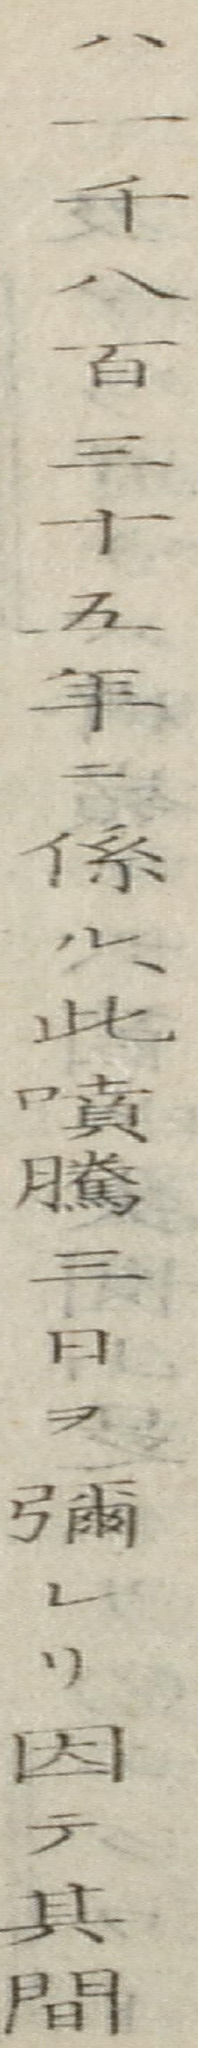ハ一千八百三十五年に係ル、此噴騰三日ヲ彌レリ因テ其間
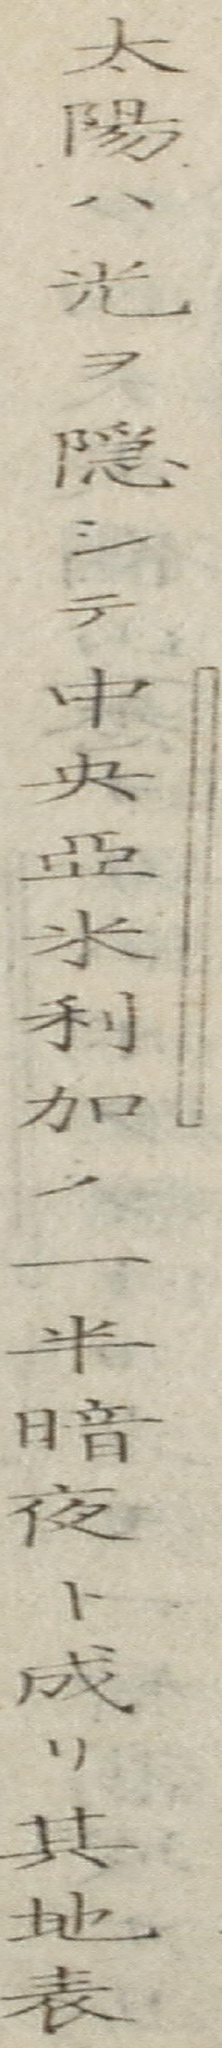太陽ハ光ヲ隠シテ中央亜米利加ノ一半暗夜ト成リ其地表
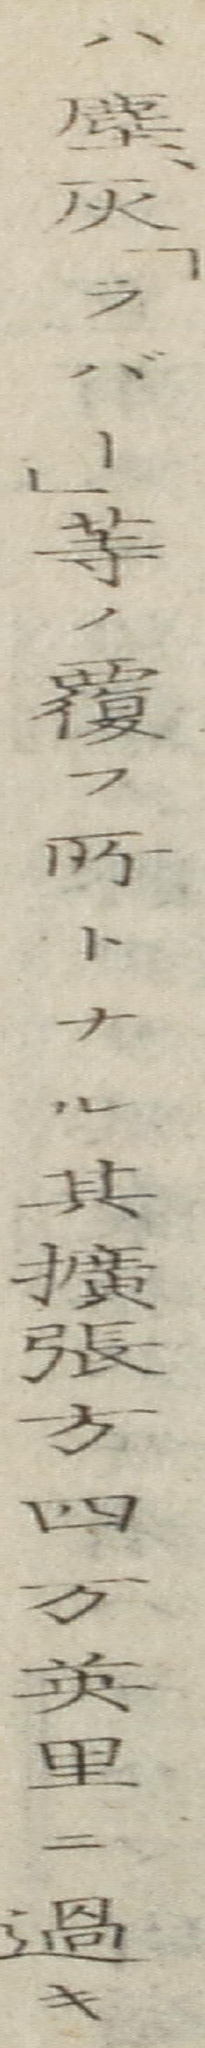ハ塵、灰「ラバー」等ノ覆フ所トナル其拡張方四万英里ニ過キ
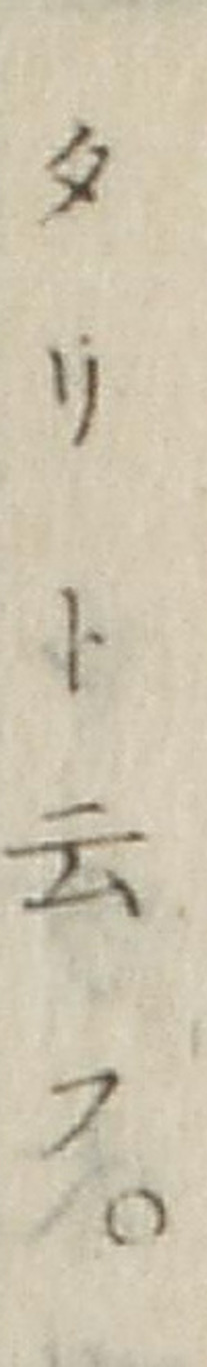タリト云フ。
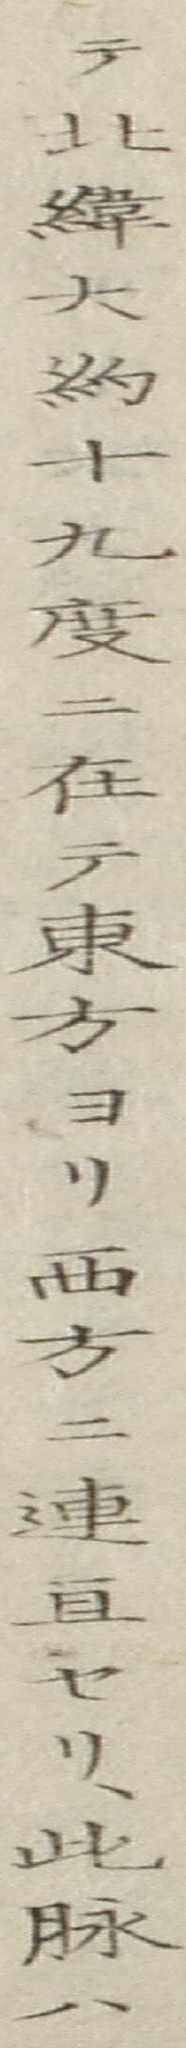テ北緯大約十九度ニ在テ東方ヨリ西方ニ連亘セリ、此脈ハ
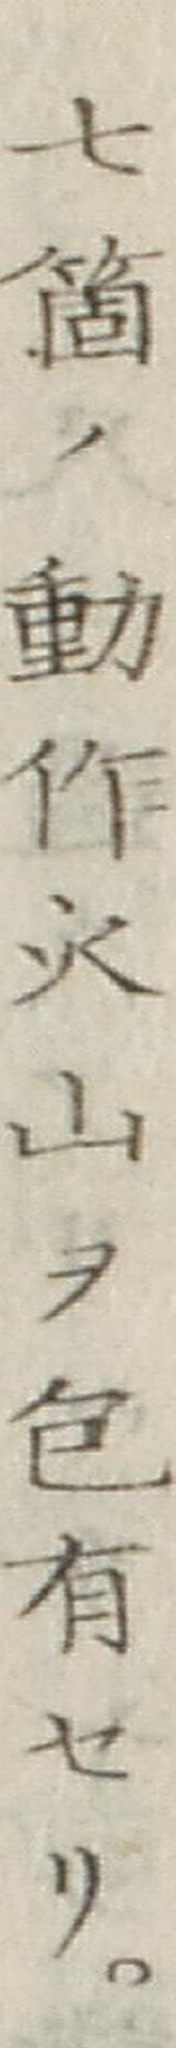七箇ノ動作火山ヲ包有セリ。
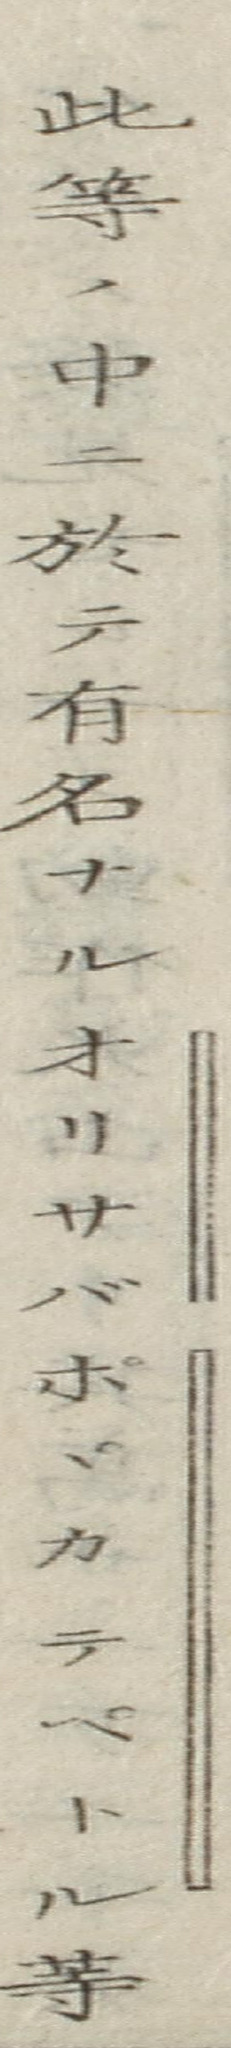此等ノ中ニ於テ有名ナルオリサバポヾカテペトル等
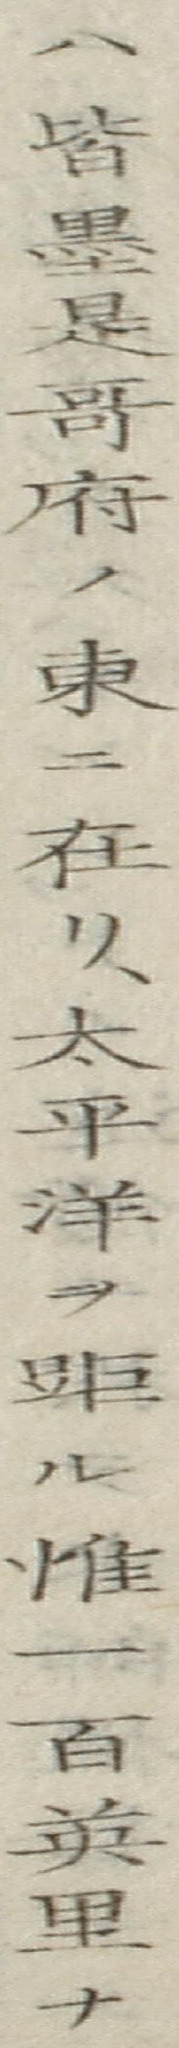ハ皆墨是哥府ノ東ニ在リ、太平洋ヲ距ル惟一百英里ナ
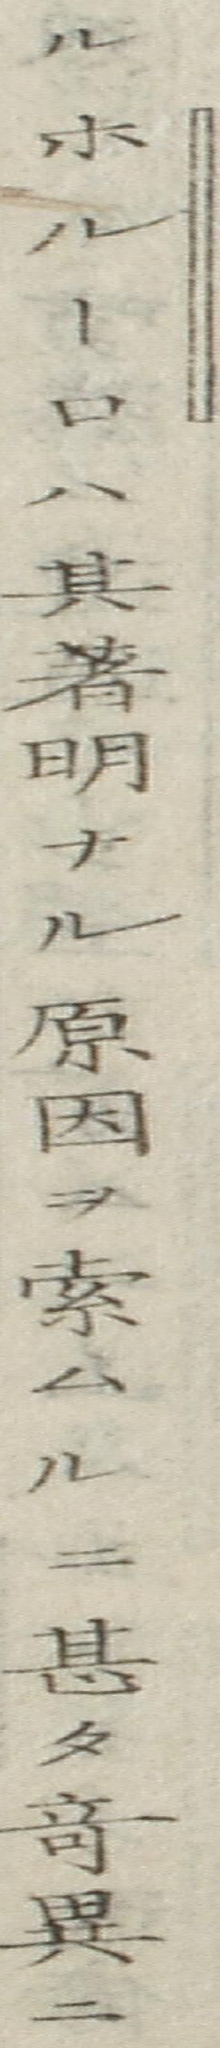ルホルーロハ其著明ナル原因ヲ索ムルニ甚タ奇異ニ
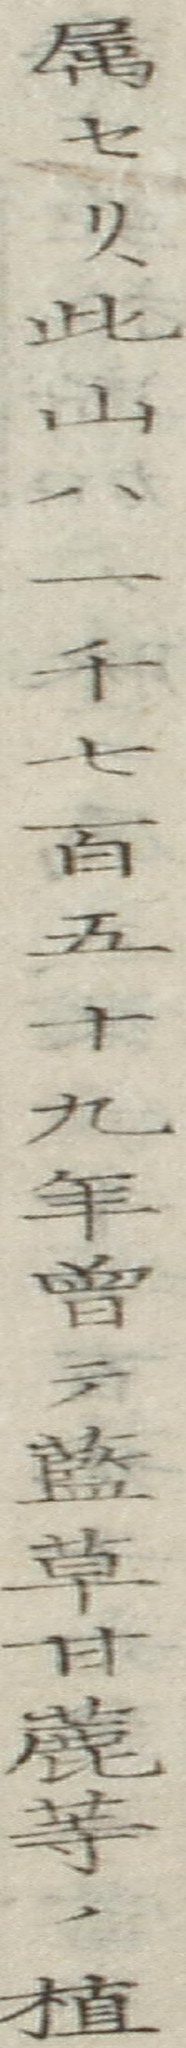属セリ、此山ハ一千七百五十九年曾テ藍草甘蔍芋ノ植
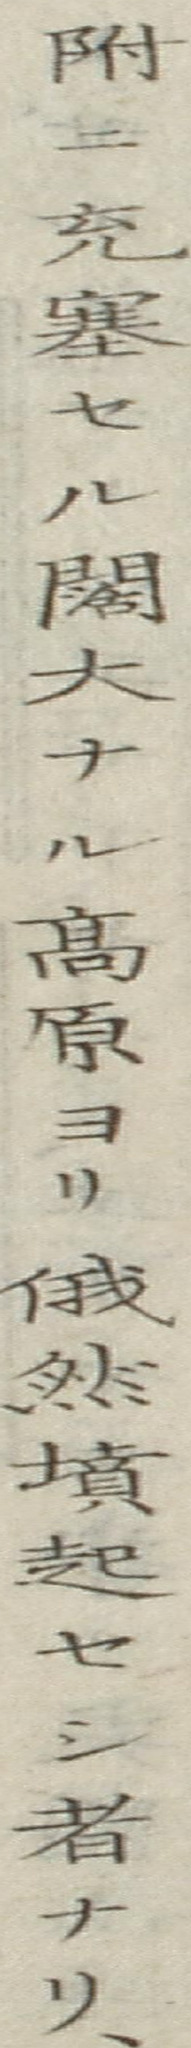附ニ充塞セル闊大ナル高原ヨリ俄然墳起セシ者ナリ、
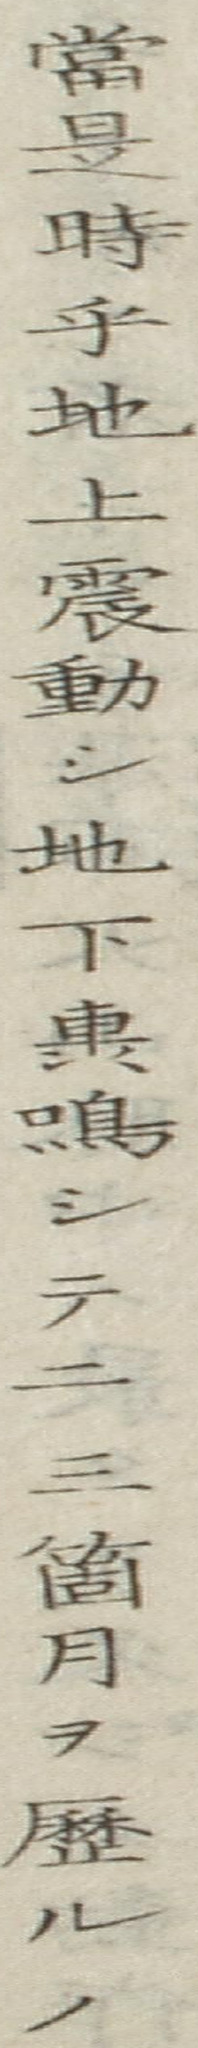当是時乎地上振動シ地下轟鳴シテ二三箇月ヲ歴ルノ
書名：地形論　巻二
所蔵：東京大学地震研究所図書室 Earthquake Research Institute Library, The University of Tokyo, JAPAN
